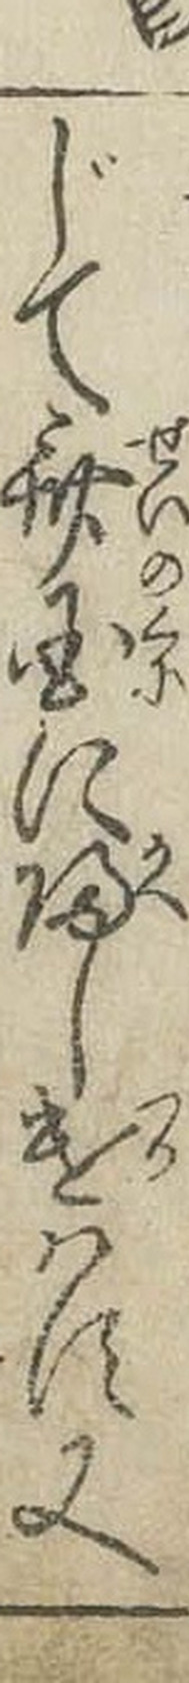じて斉国に帰し遣はす又
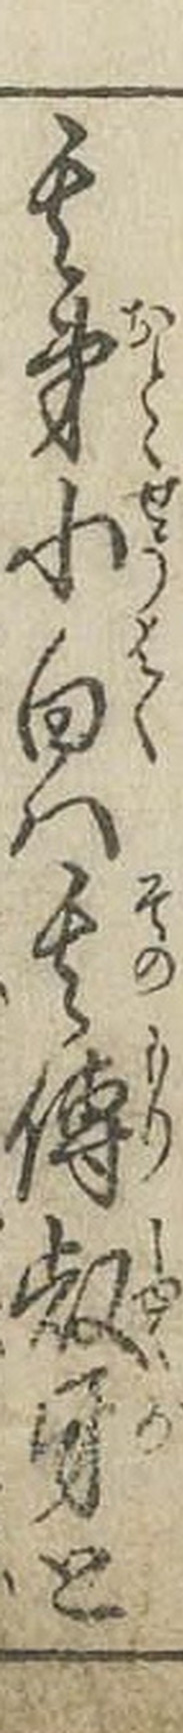其弟小白は其傅叔牙と
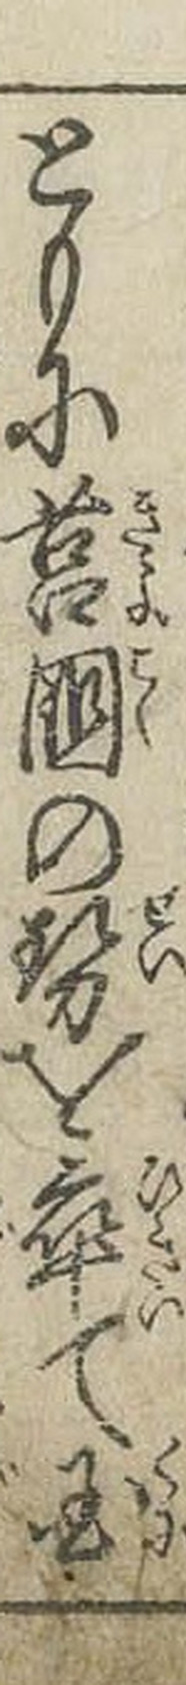ともに莒国の勢を率て国
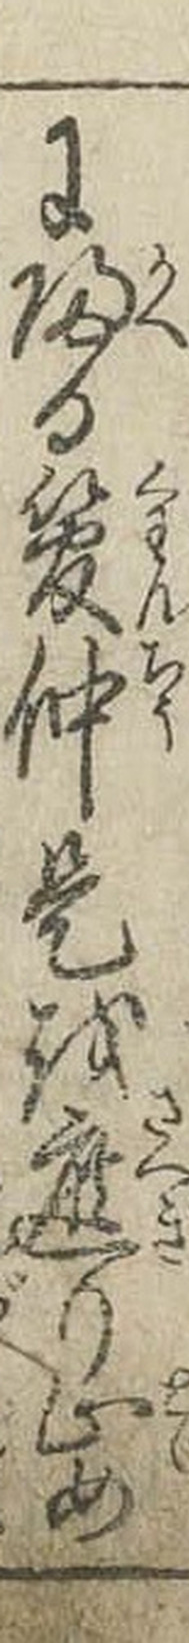に帰る管仲是を遮り止め
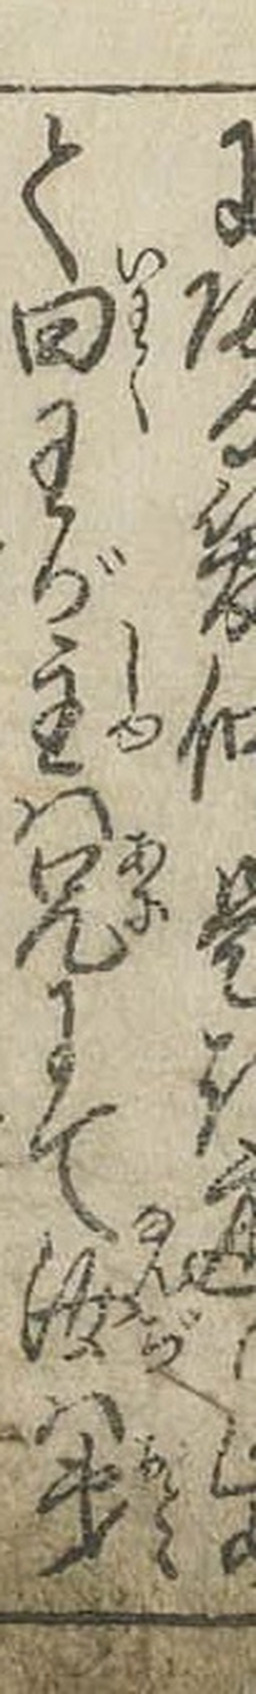て曰わが主は兄にて汝は弟
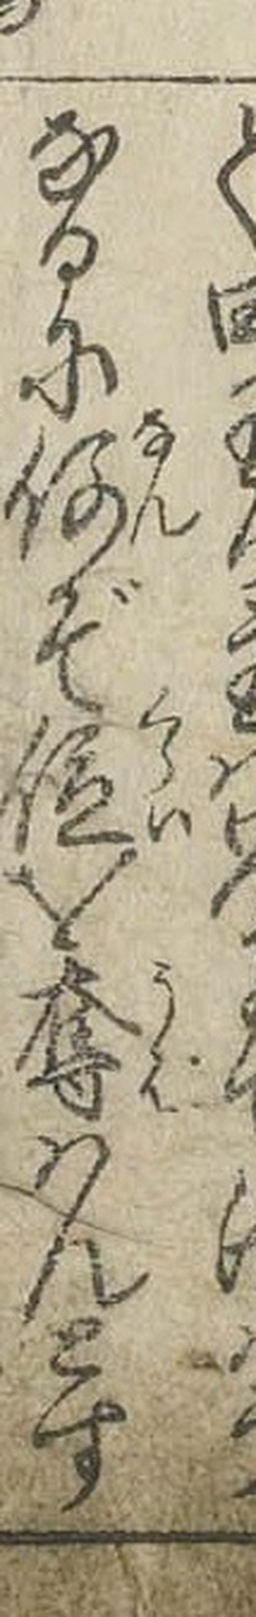なるに何ぞ位を奪はんとす
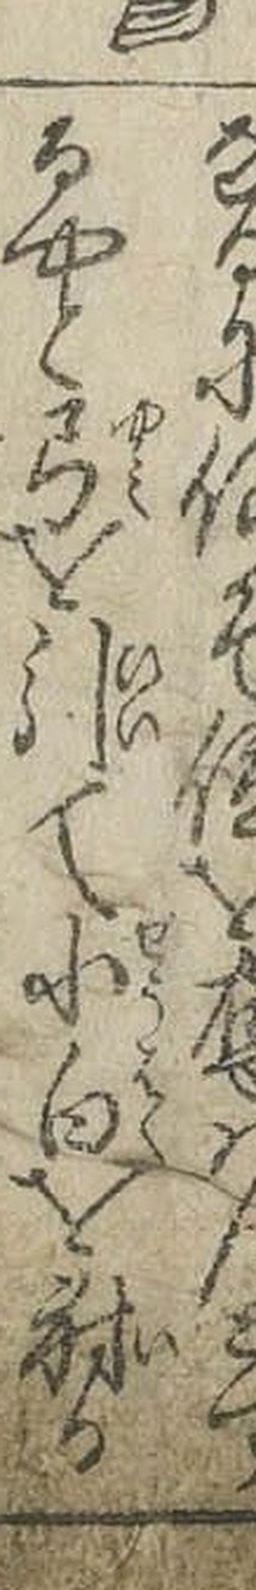るやと弓を引て小白を射る
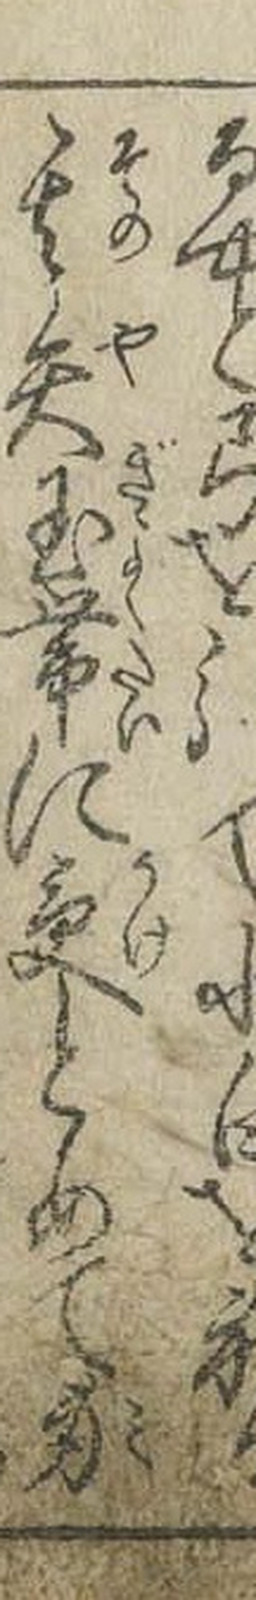其矢玉帯に受とめて身
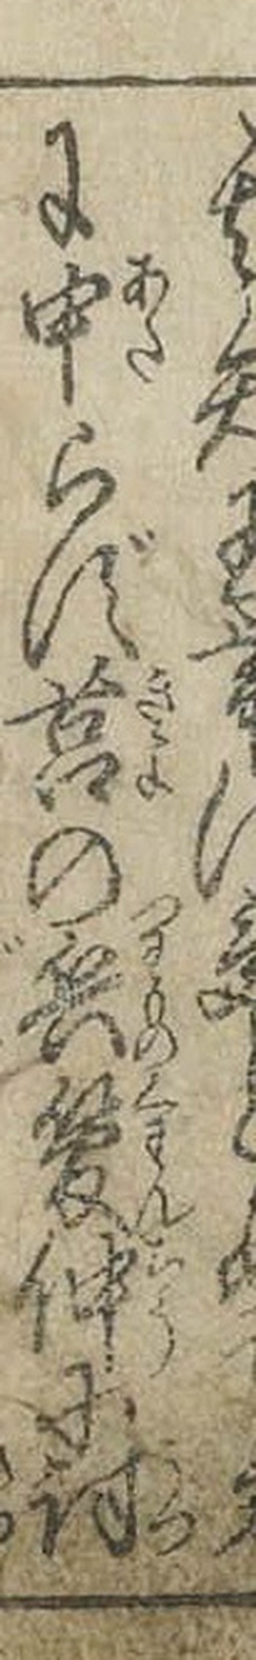に中らず莒の兵管仲に討
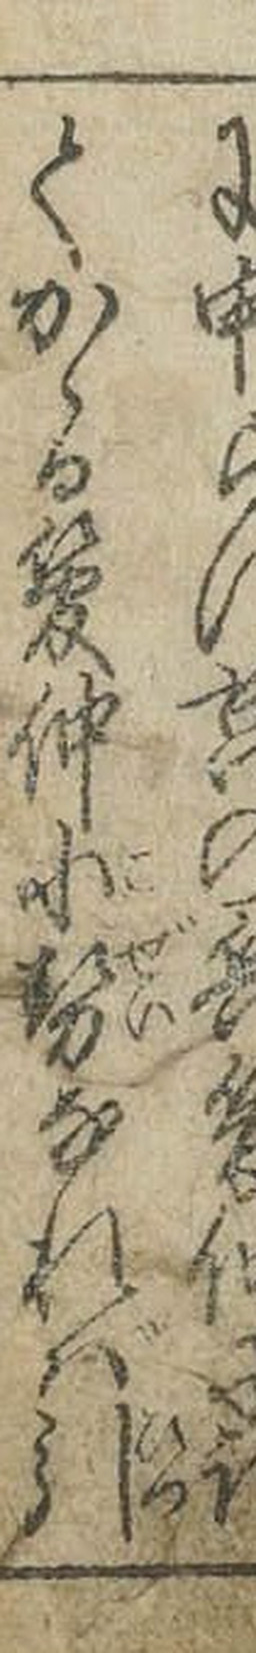てかゝる管仲小勢なれば引

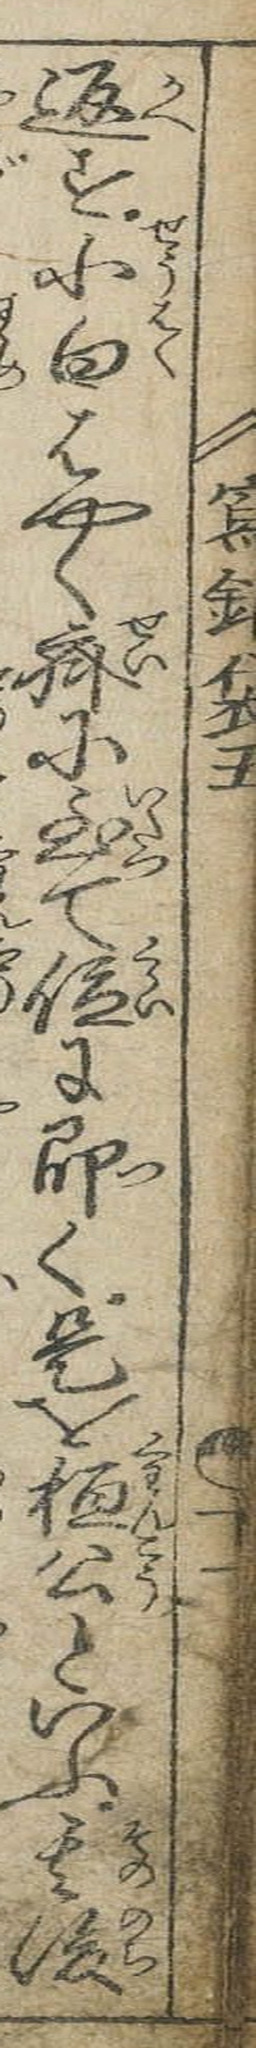返す。小白はやく斉に至て位に即く。是を桓公といふ。其後
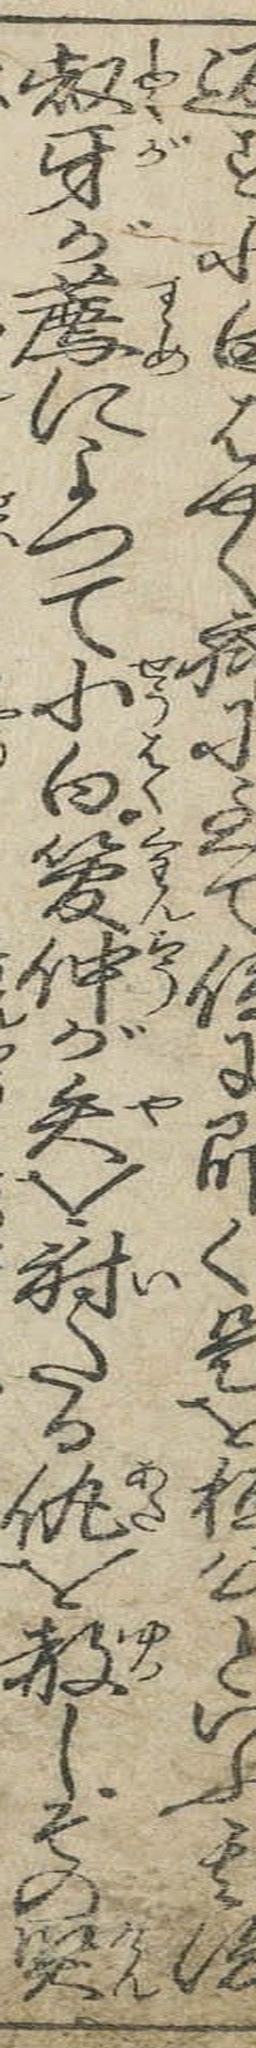叔牙が薦によつて小白。管仲が矢を射たる仇を赦し。その賢
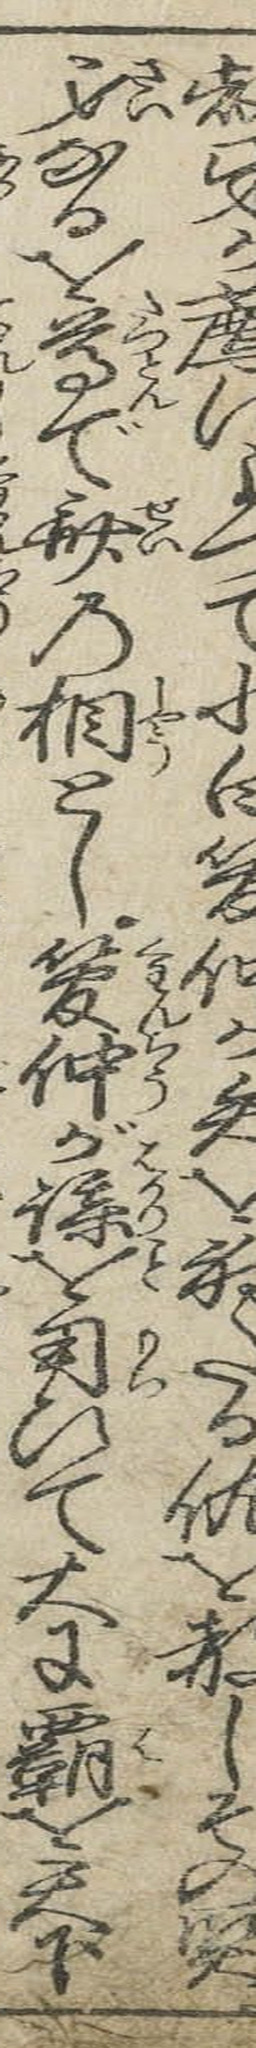才なるを尊で斉の相とし。管仲が謀を用ひて大に覇を天下
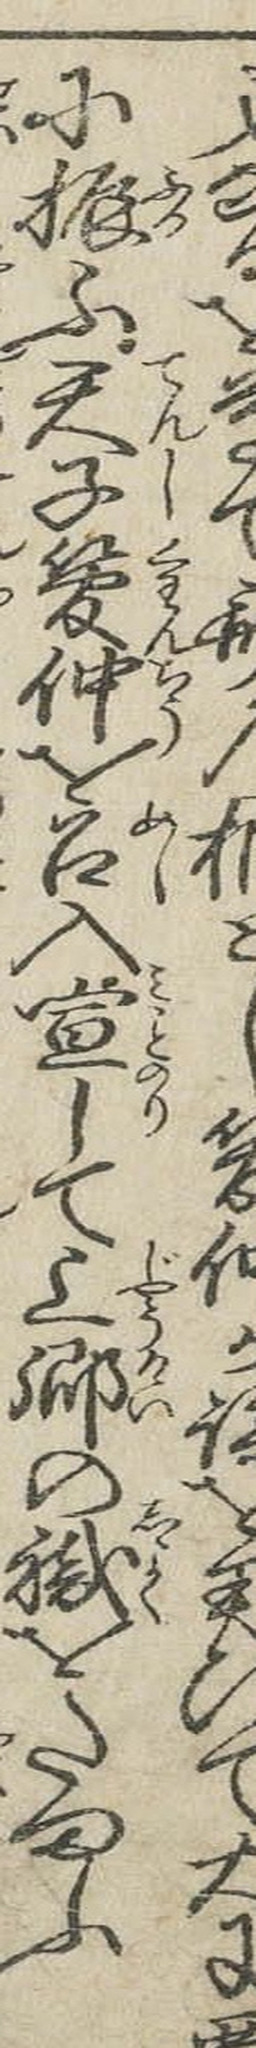に振ふ。天子管仲を召入宣して上卿の職をたまふ
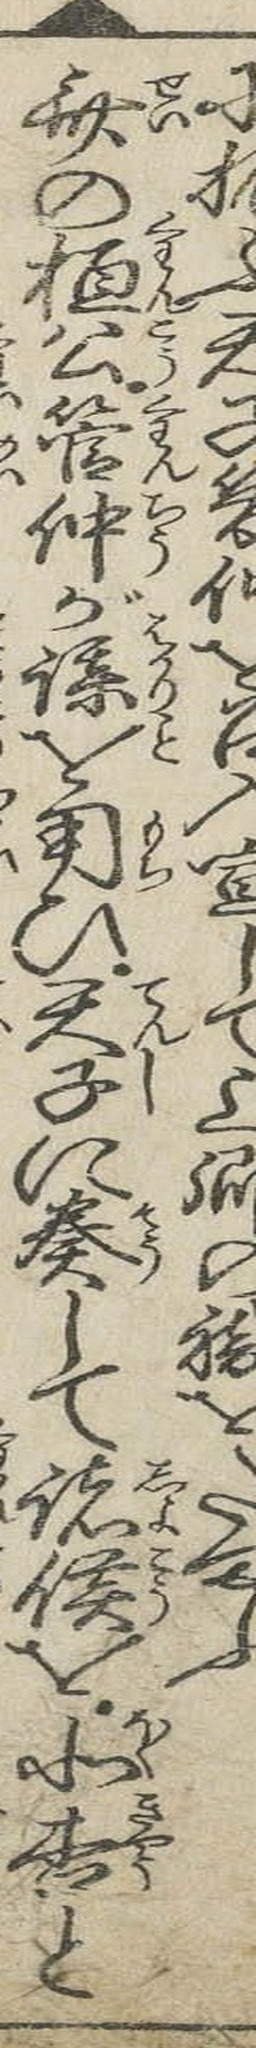斉の桓公。管仲が謀を用ひ。天子に奏して諸侯を。北杏と
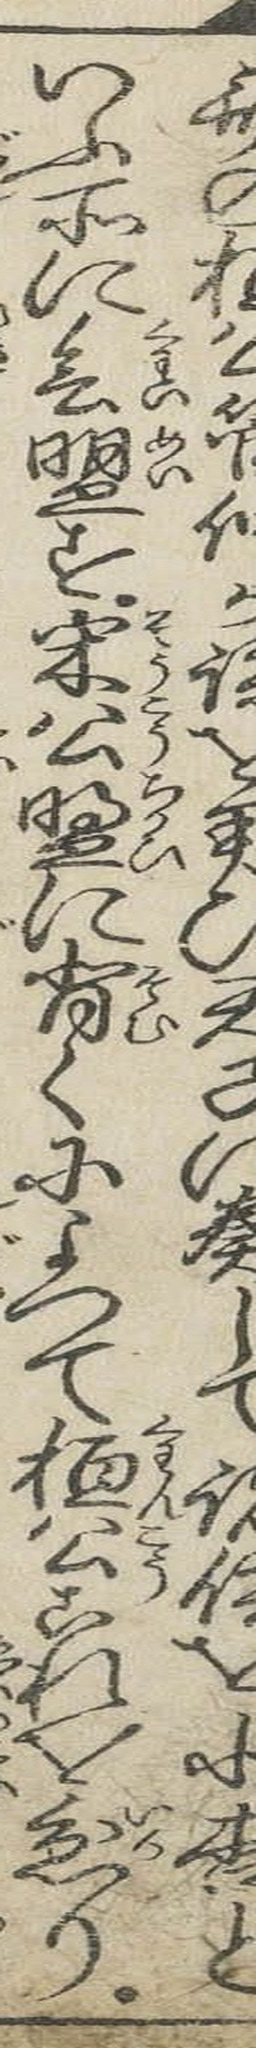いふ所に会盟す。宋公盟に背くによつて桓公これを忿り。
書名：絵本写宝袋 9巻 5之巻
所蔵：東京学芸大学教育コンテンツアーカイブ
